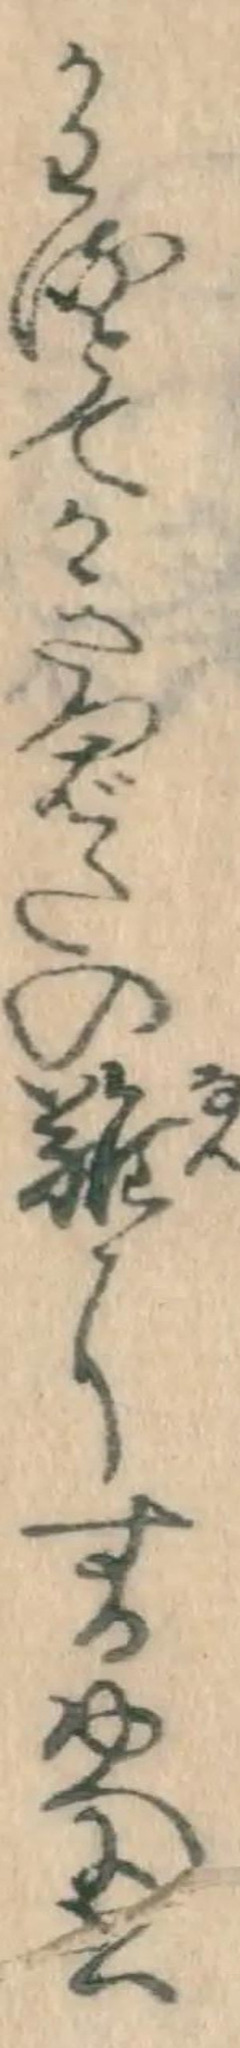かわるとてかきつばたの難にするゆへに書

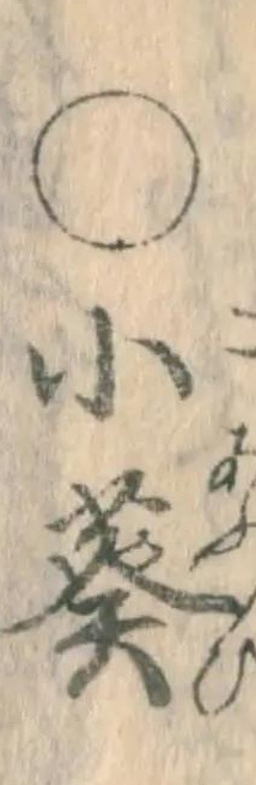〇小葵
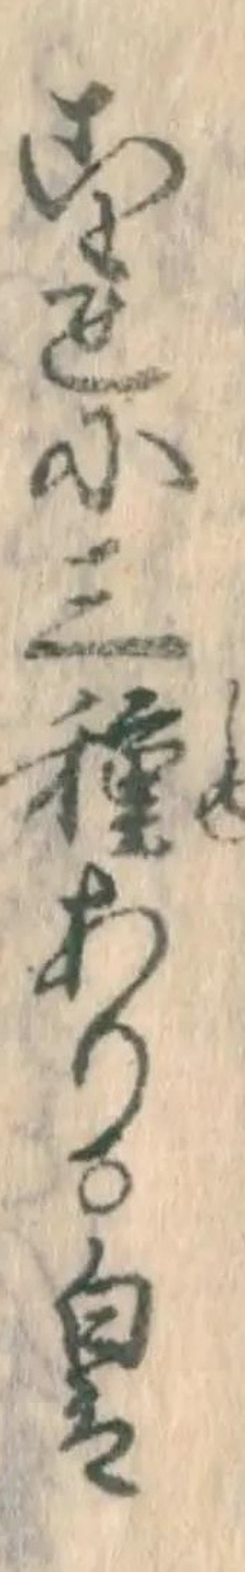これに三種あり〇白は
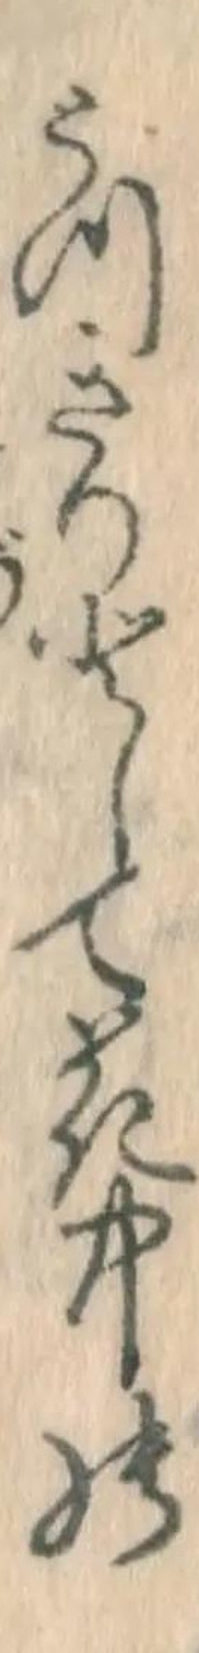くつきりとして花中の
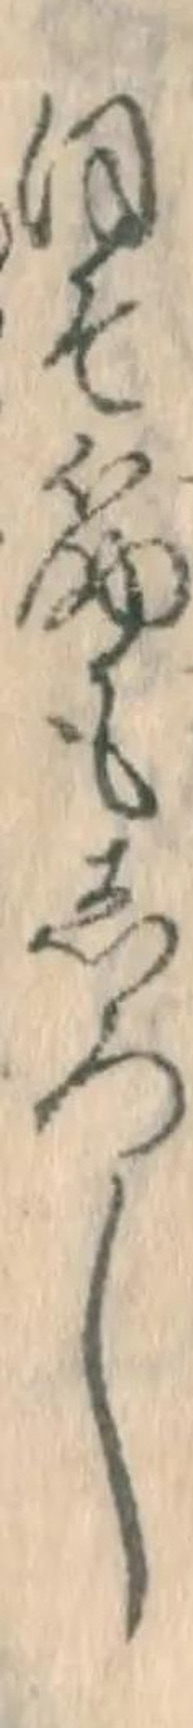ほそ筋もしろく
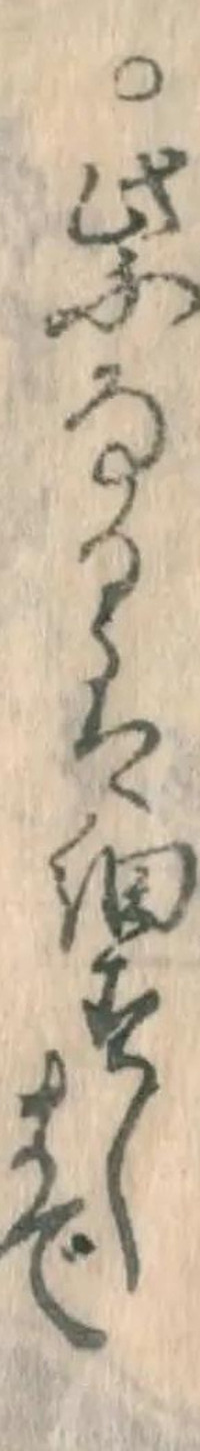〇紫なるは細すしまで
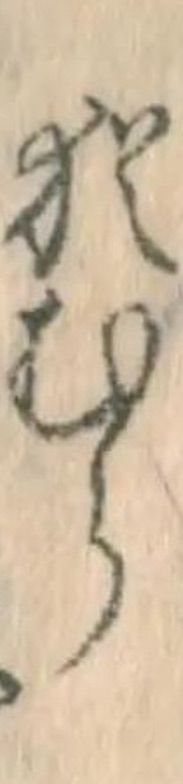猶むら
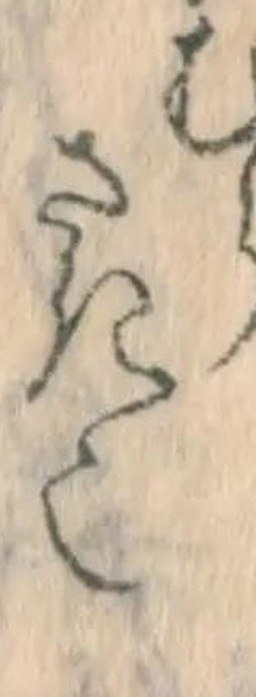さき也
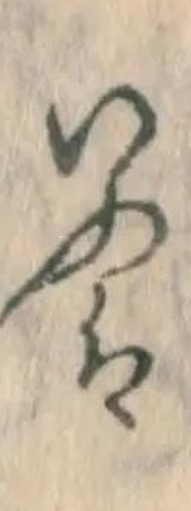いふは
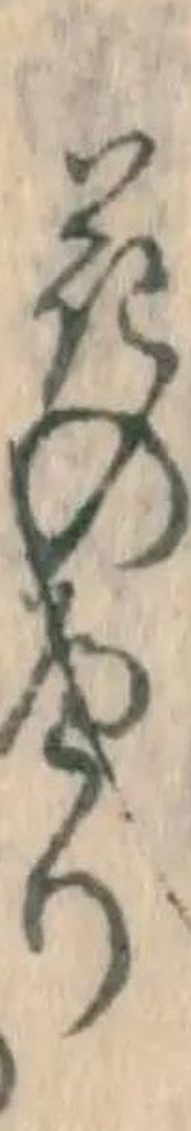花のへり
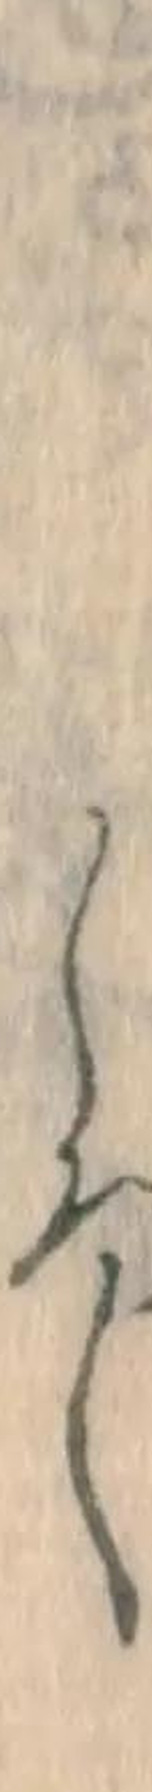しろく
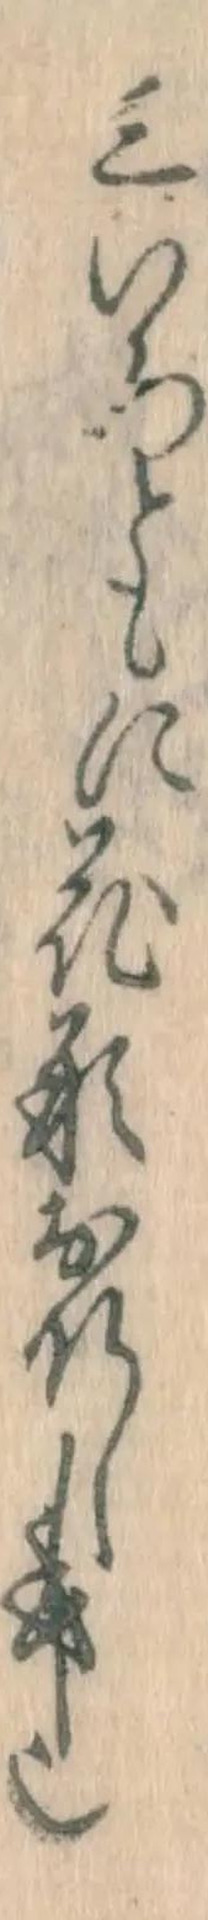三いろともに花形おなし事也
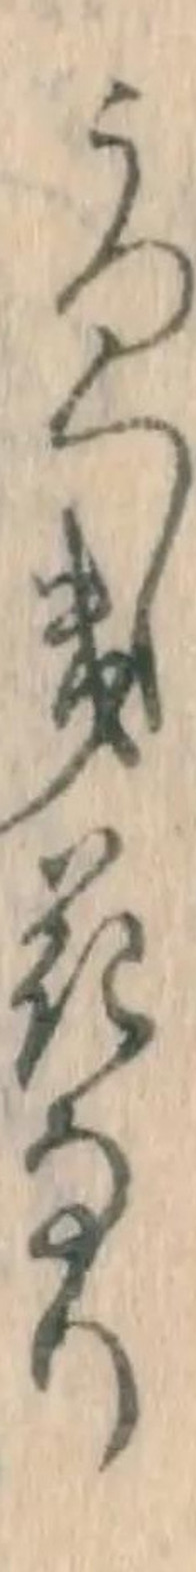うつくしき花なり
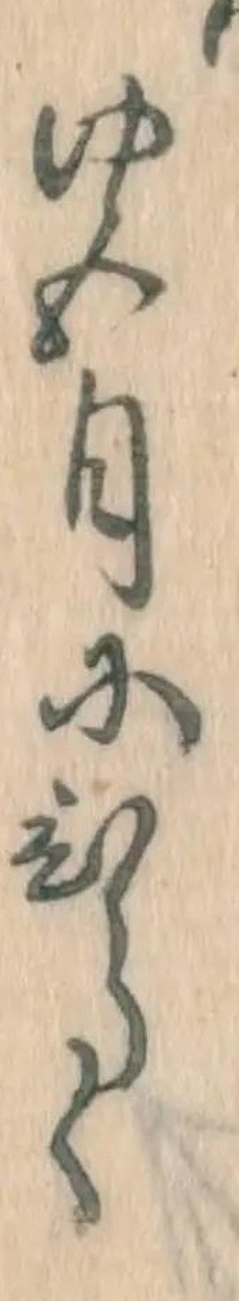四五月にひらく
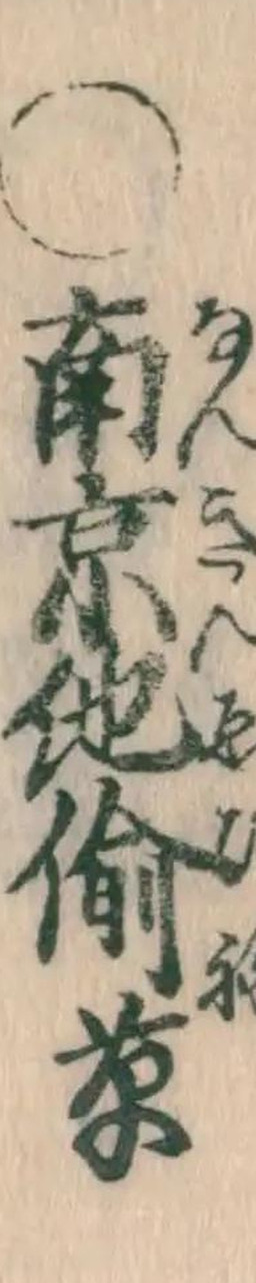〇南京他偸草
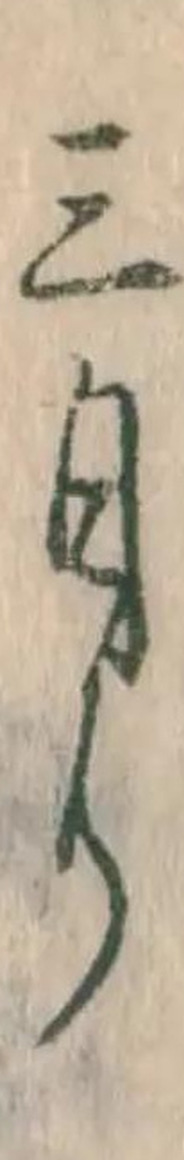三月に
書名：艸花繪前集. [1]
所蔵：国立国会図書館 National Diet Library, JAPAN
